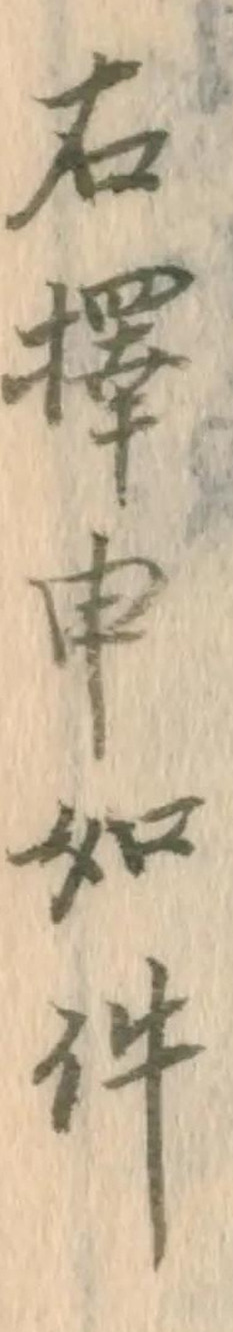右択申如件
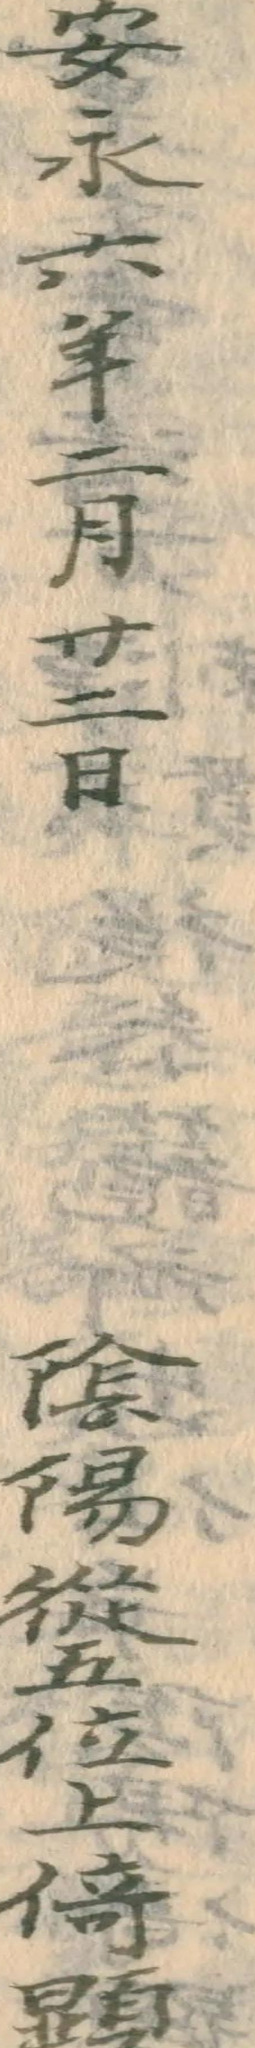安永六年二月廿二日陰陽従五位上倚顕
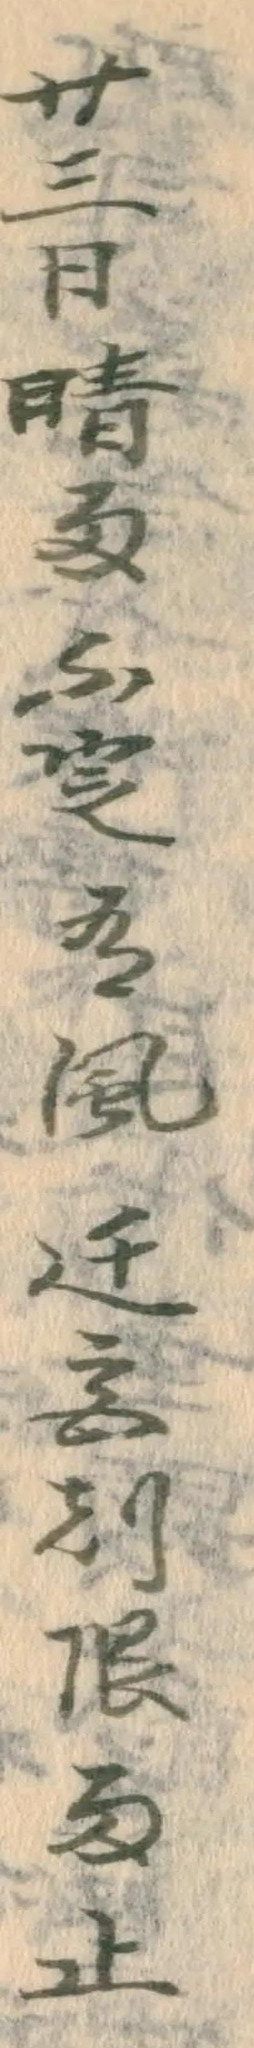廿三日晴雨不定有風迁宮刻限雨止
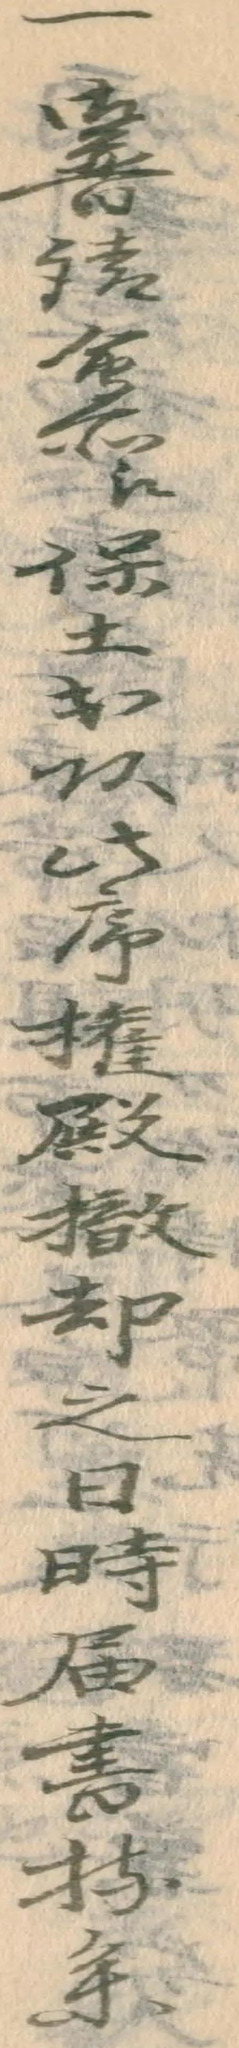一御普請会所江保土出頭此序権殿撤却之日時届書持参
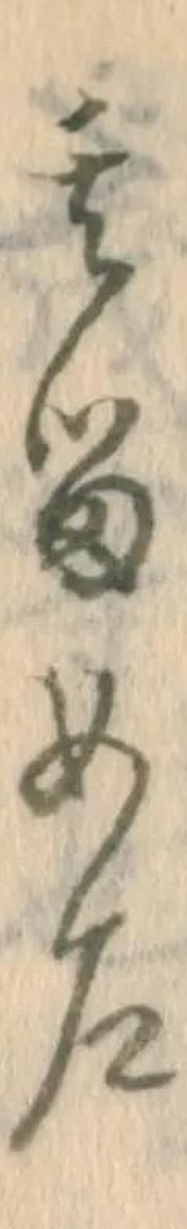其留如左
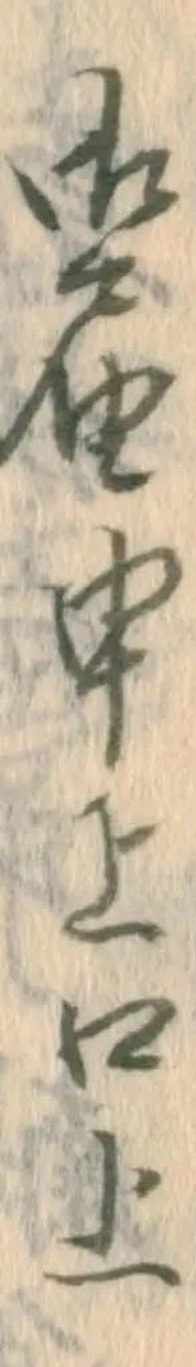御届申上口上
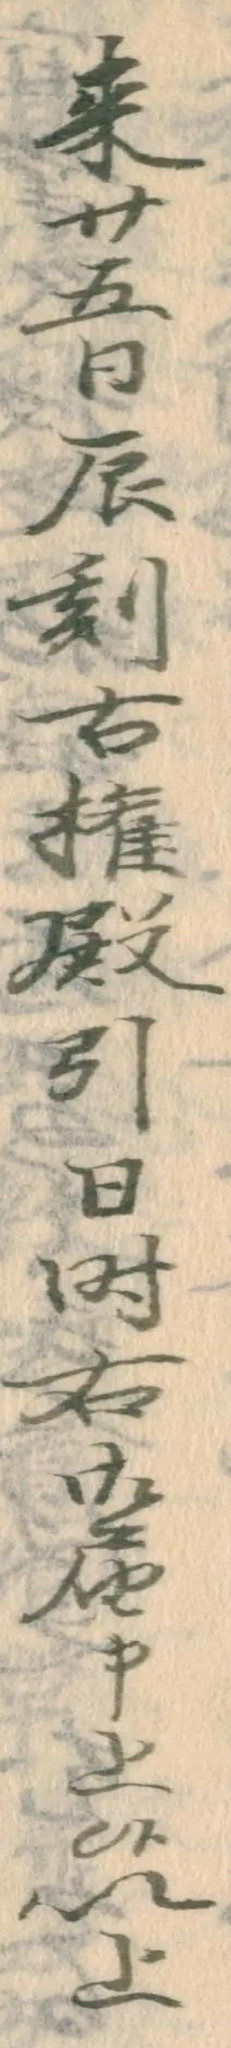来廿五日辰刻古権殿引日時右御届申上候以上
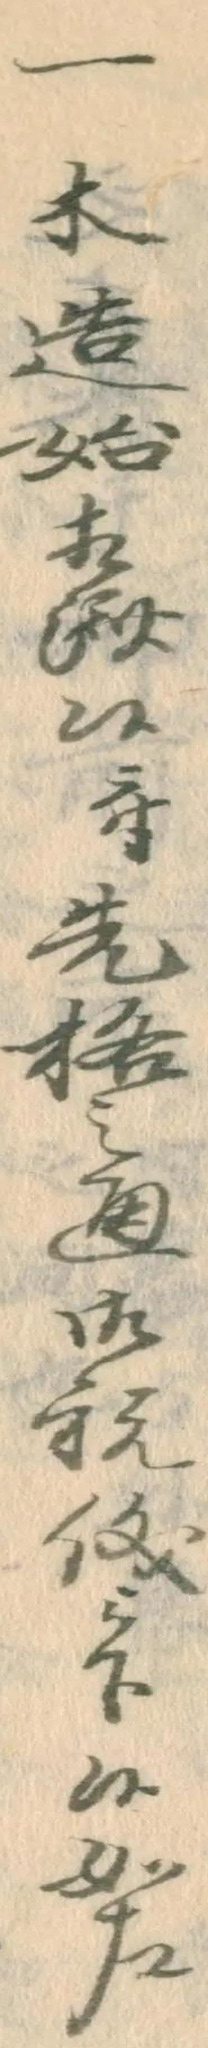一木造始相済候ニ付先格之通御祝儀被下候如左
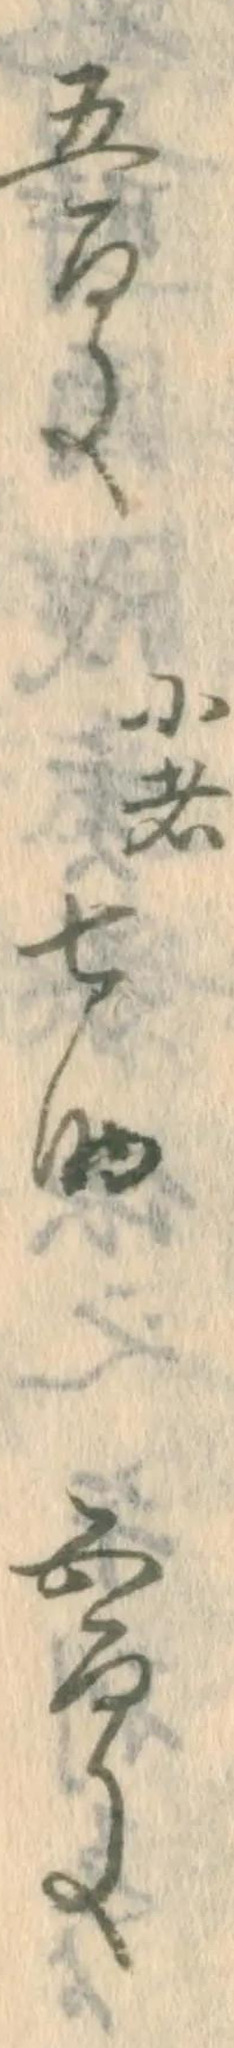五百文七助五百文藤吉

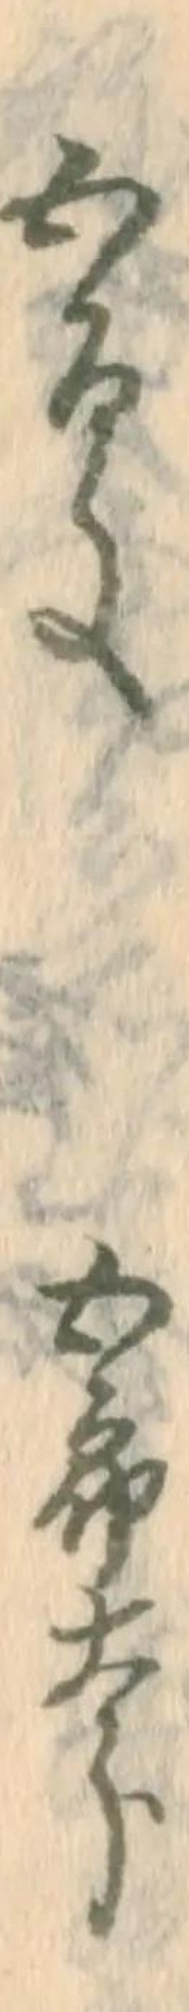五百文五郎太郎
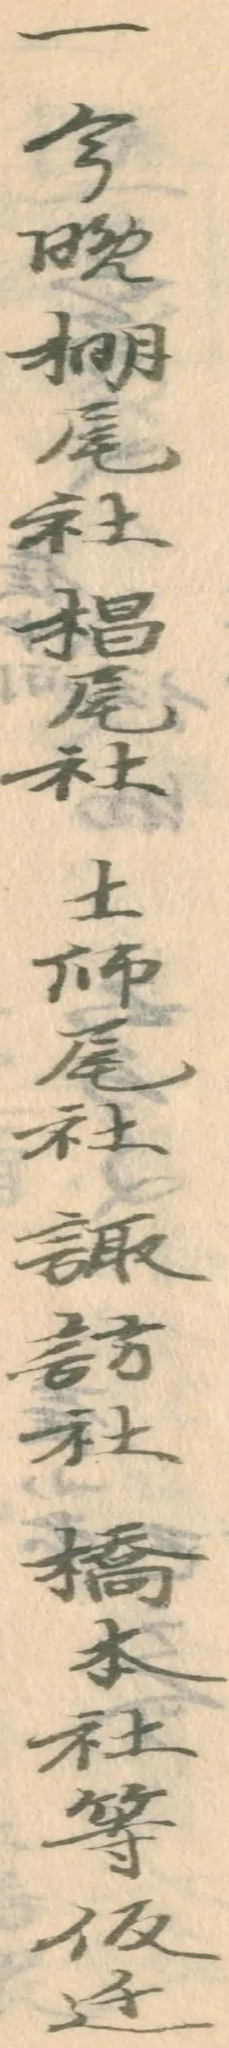一今晩棚尾社椙尾社土師尾社諏訪社橋本社等仮迁
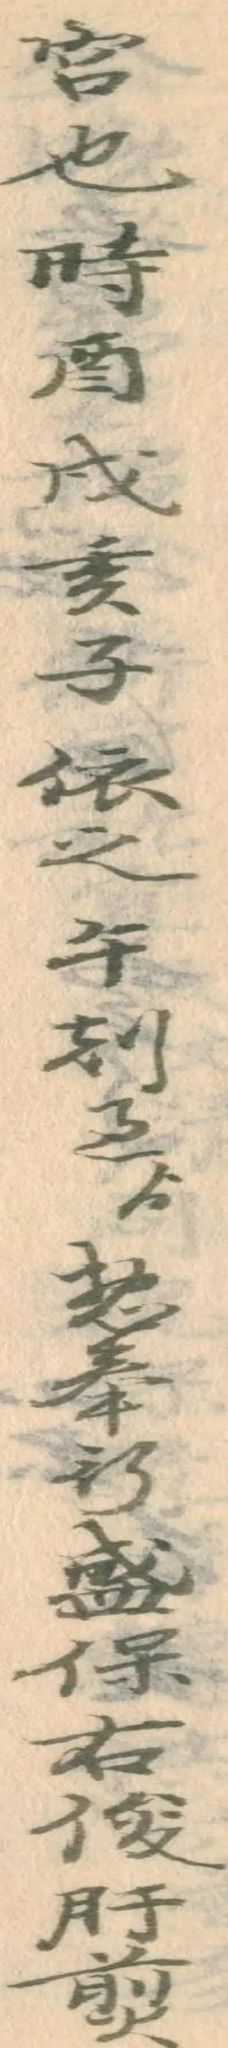宮也時酉戌亥子依之午刻過ゟ惣奉行盛保右俊肝煎
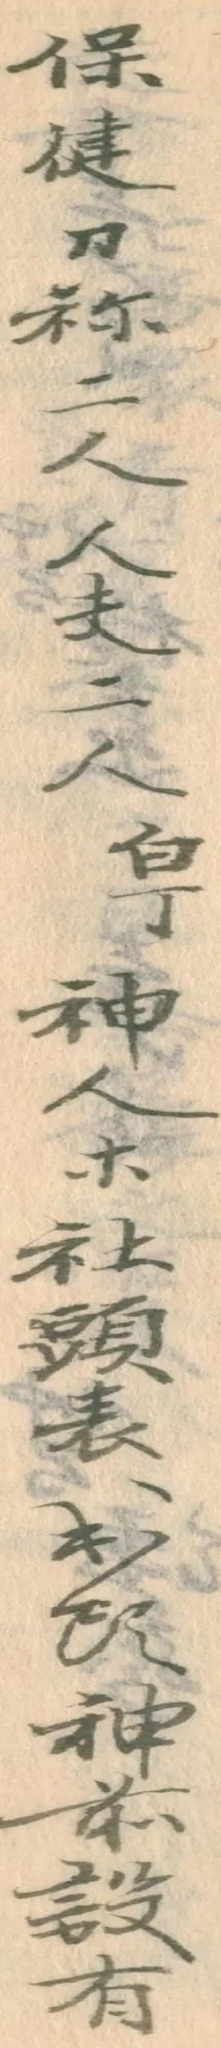保健刀祢二人人夫二人白丁神人等社頭表へ出頭神前設有
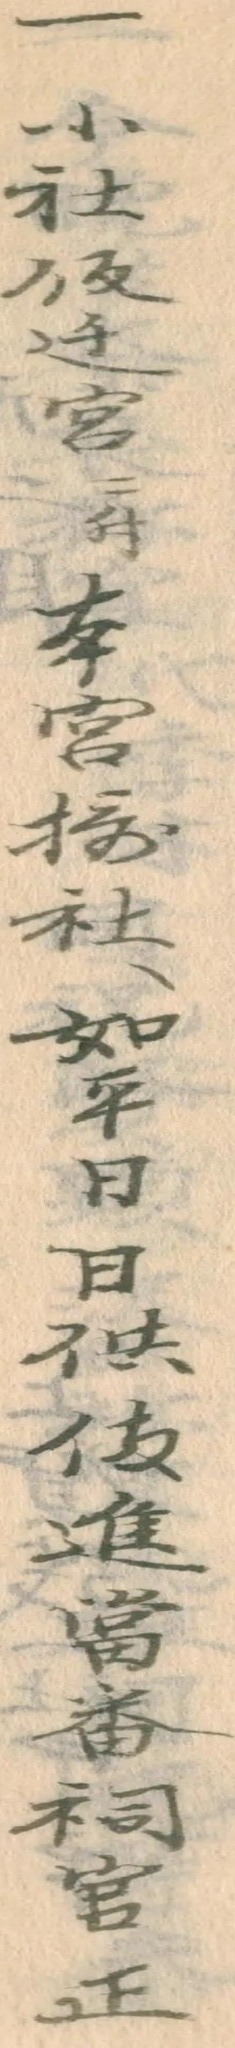一小社仮迁宮ニ付本宮摂社ヘ如平日日供備進当番祠官正
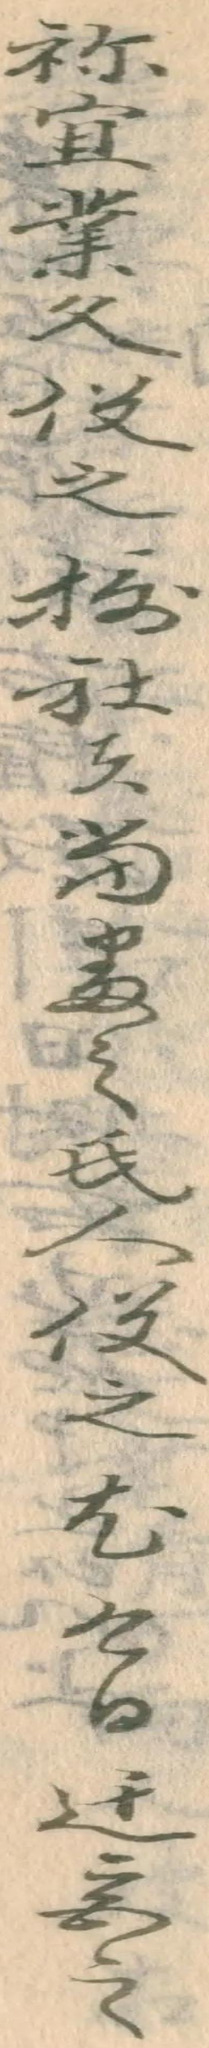祢宜業久役之摂社は当番之氏人役之尤今日迁宮之
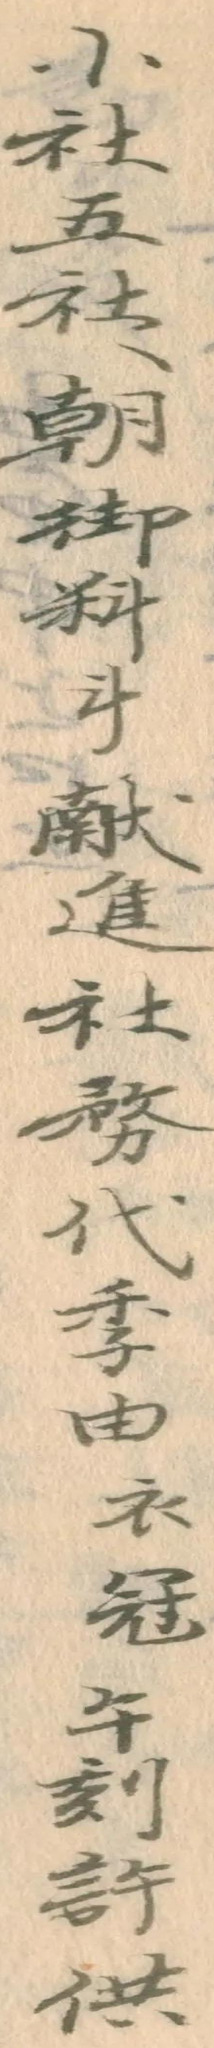小社五社ヘ朝御料計献進社務代季由衣冠午刻許供
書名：賀茂社記録. 第17冊
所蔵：国立国会図書館 National Diet Library, JAPAN
